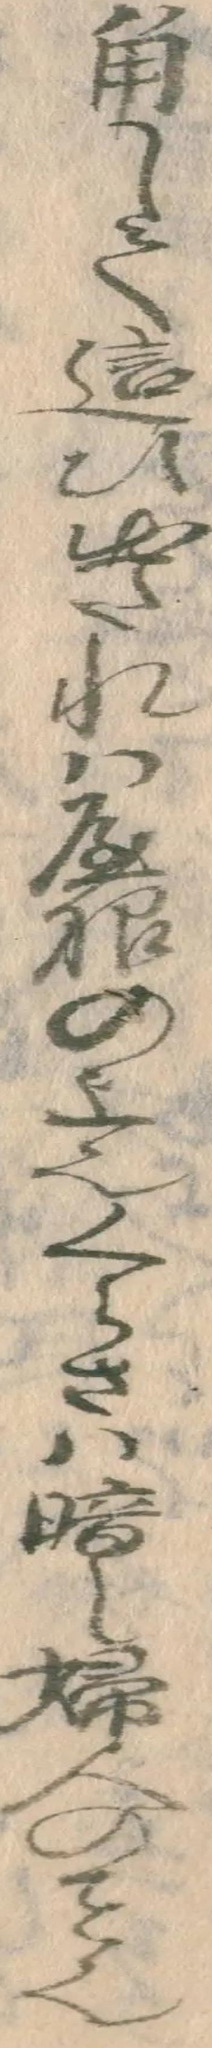角して這ひ出たれハ屋根の上也くらさハ暗し婦人のこと也
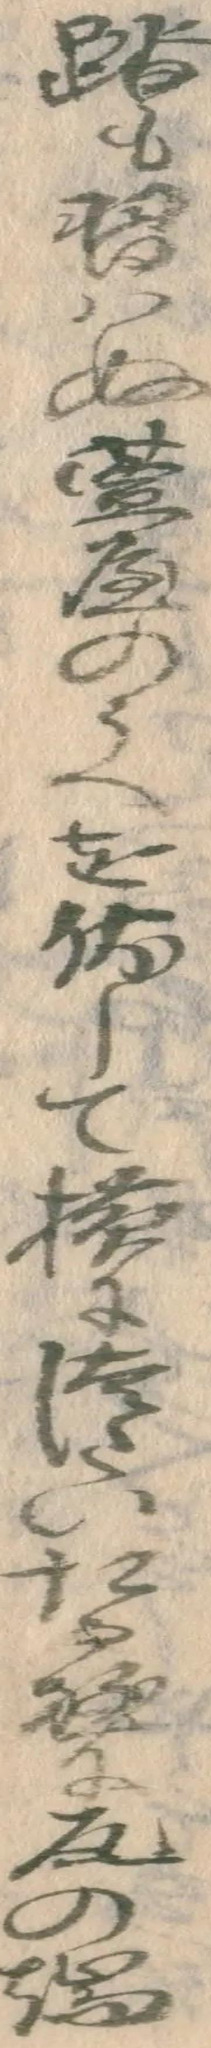踏も習ハぬ萱屋のうへを伏して横につたいたる程に瓦の端
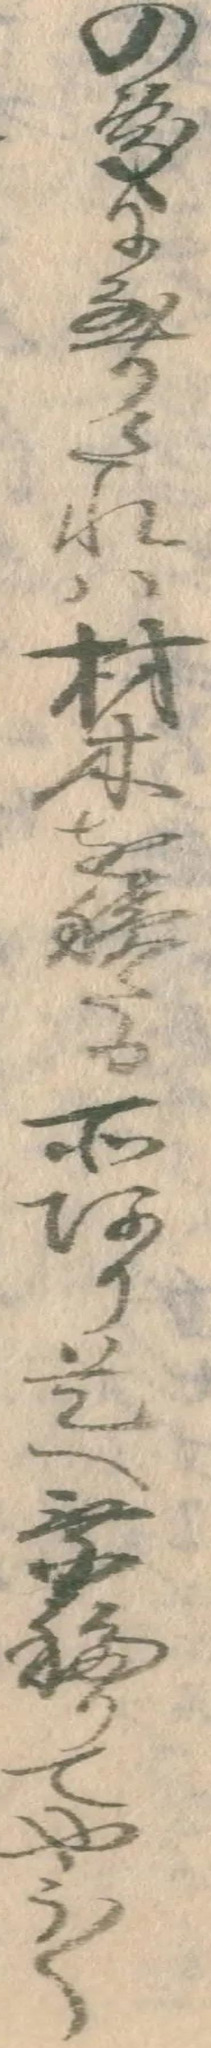の処に至りたれハ材木を結たる所あり是へ乗移りてやうやう
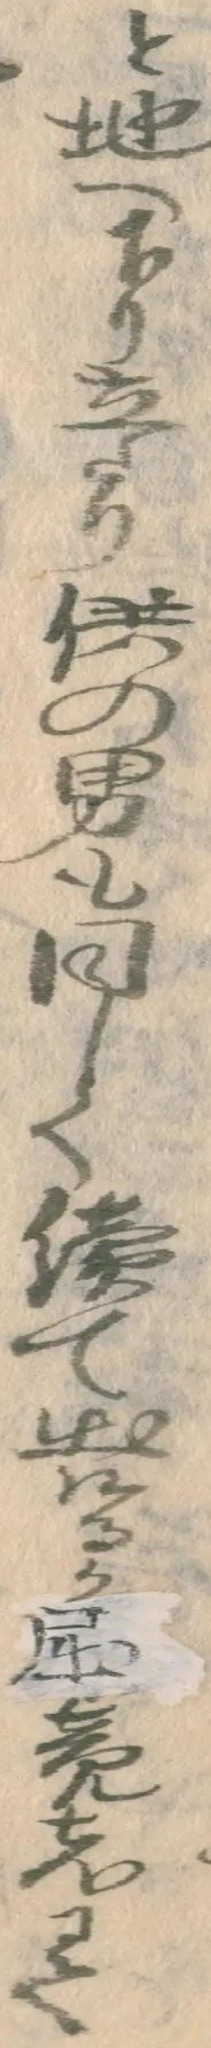と地へ下り立たり供の男も同しく続て出たるか屈竟にて
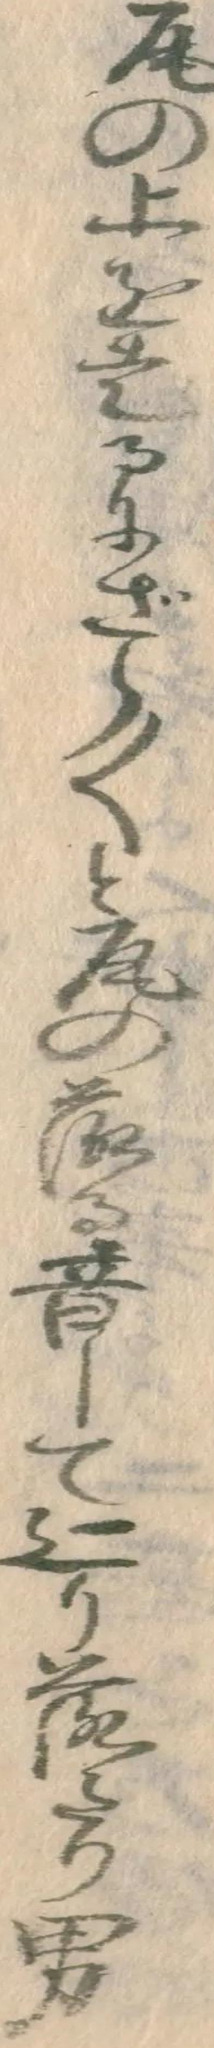瓦の上を走るにざくざくと瓦の落る音して辷り落たり男
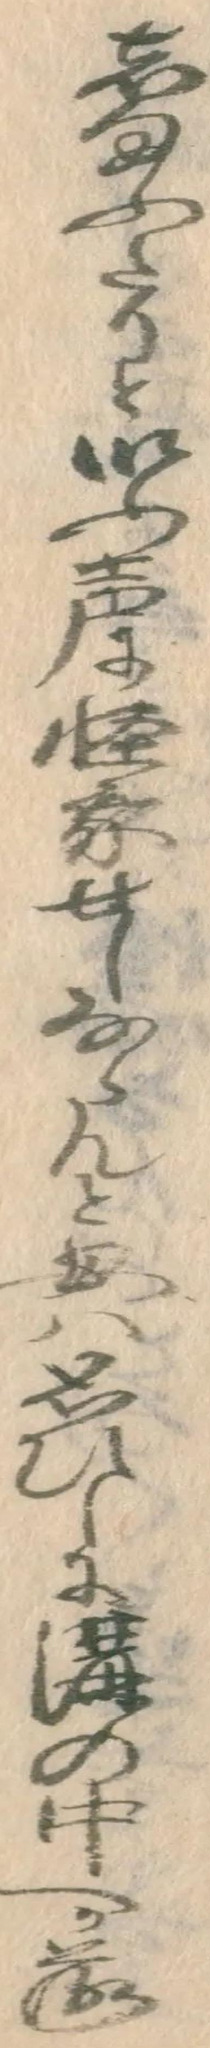ふたりといふ声に怪我せしならんと母は思ひしに溝の中へか落
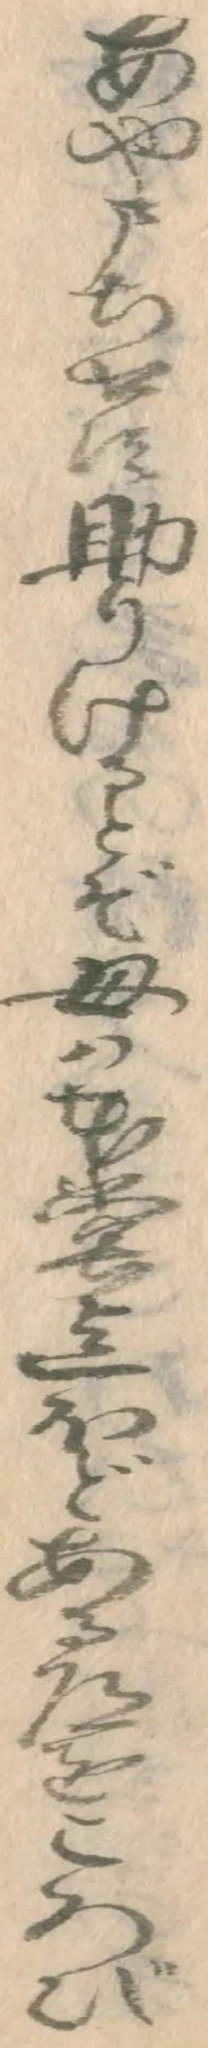あやまちせす助りけるとそ母ハ本堂迄ほどある道をころび

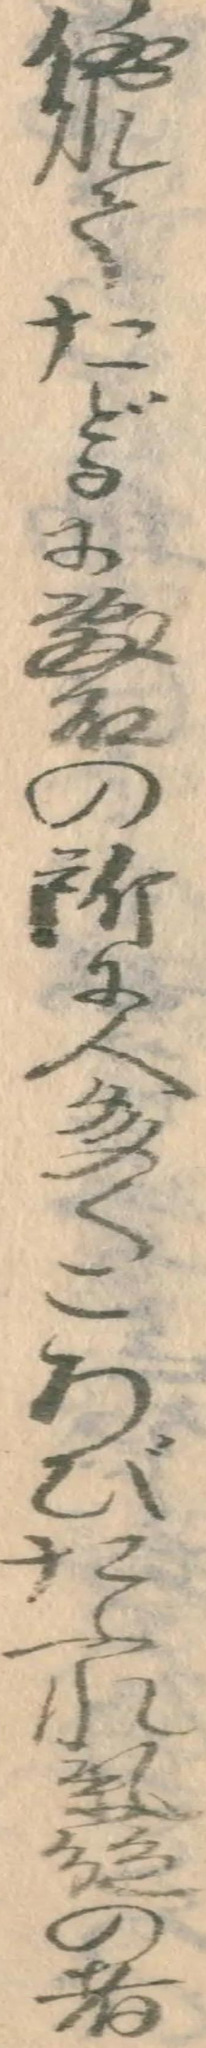倒れてたどるに敷石の所に人多くころびたふれ気絶の者
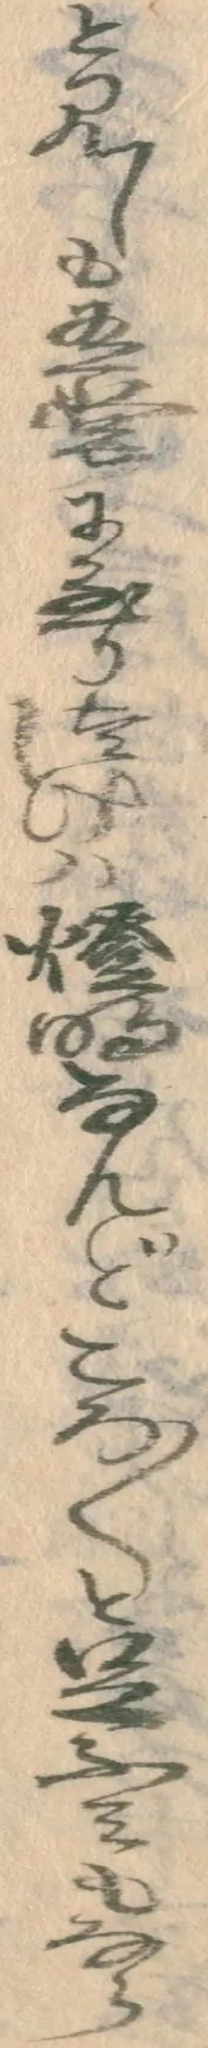と見しも本堂に至りつけハ燈明なんどころ〳〵と足ふミもなら
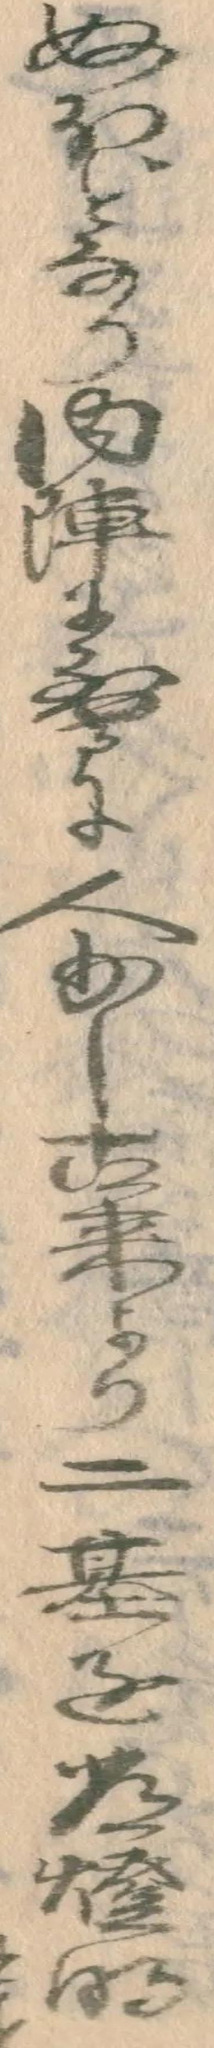ぬほどなり内陣に着に人少し古来より二基を常燈明とす
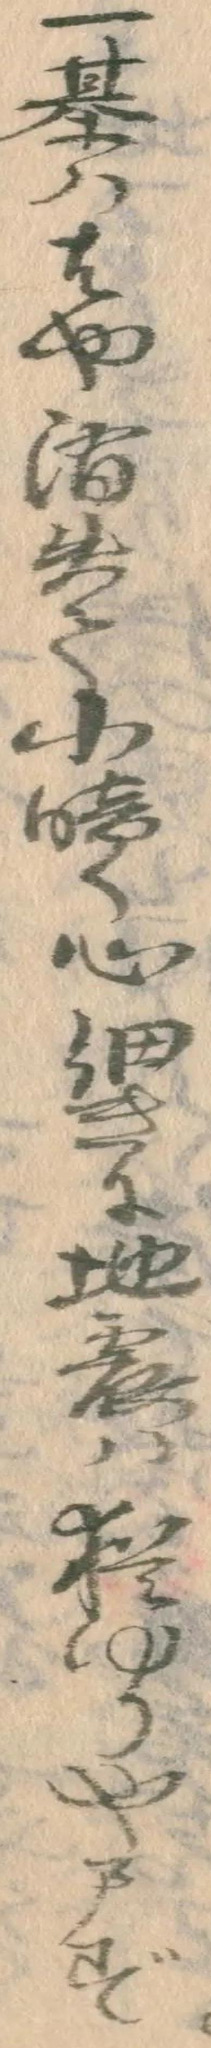一基ハはや消失て小暗く心細きに地震ハ猶ゆりやまず
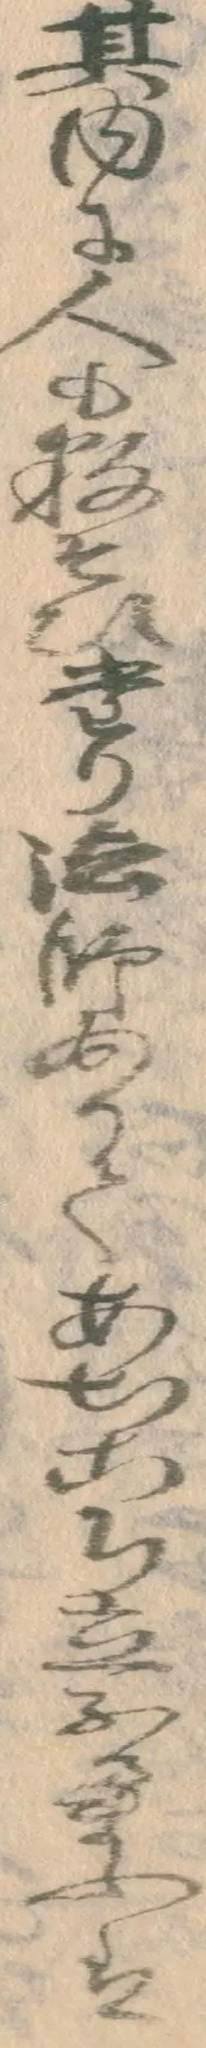其内に人も救そひけり法師ありてあちこち立ふるまふは
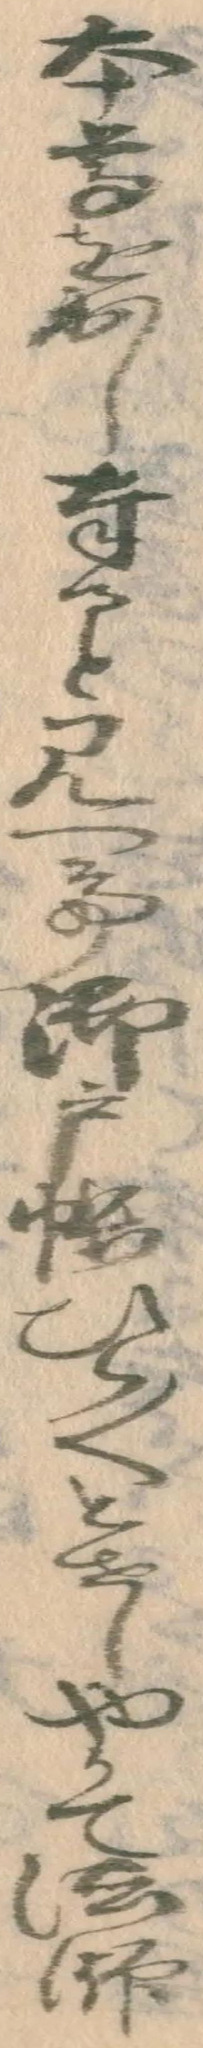本堂を出しきると見つて御戸帳ひらくとせしやかて法師
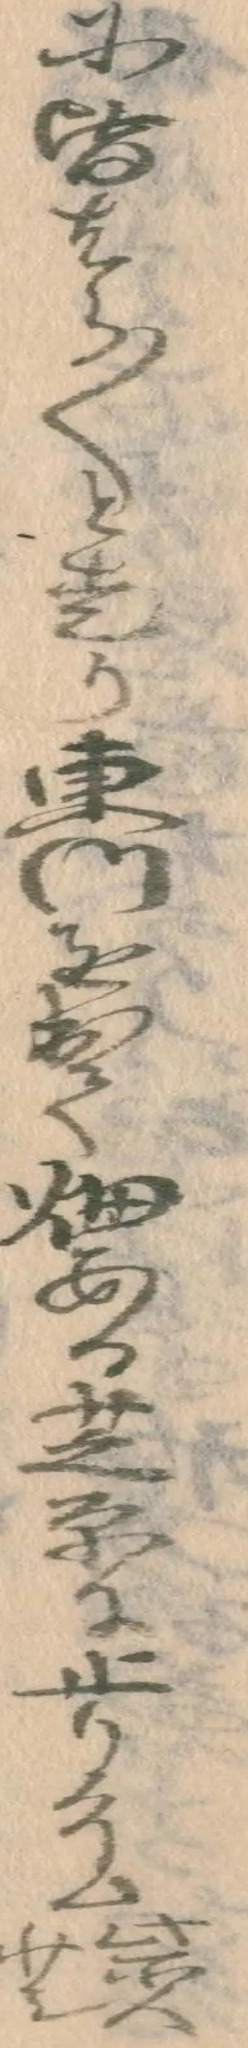に皆はら〳〵と走り東門を出て畑ある芝原に止りけり此所人少シ
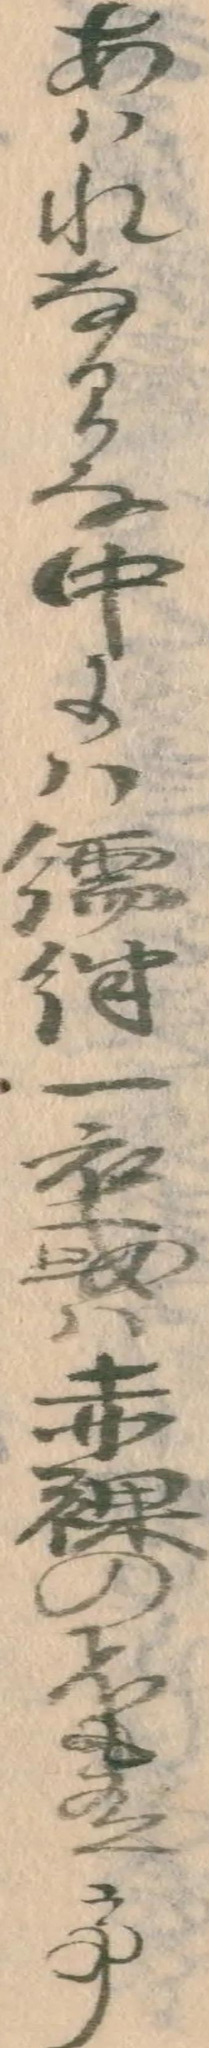あハれなるかな中にハ襦袢一枚或ハ赤裸の者も有之て
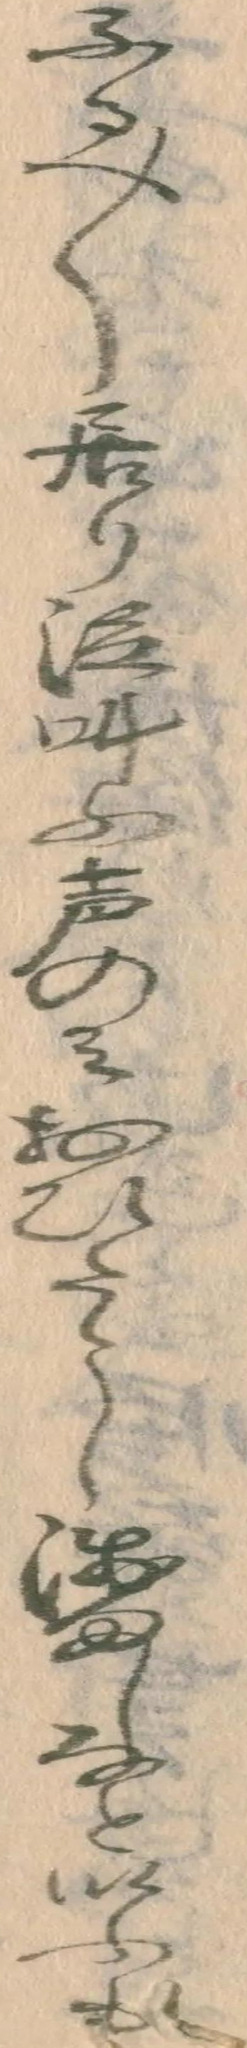ふるへ〳〵居り泣叫ふ声のミおひたゝし銭出しなといふも
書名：信州大地震之記
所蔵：国立国会図書館 National Diet Library, JAPAN
